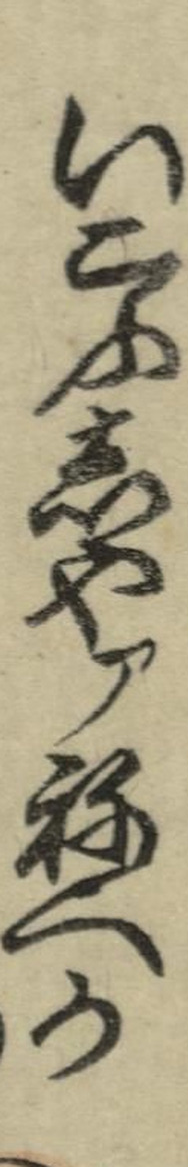いこふしやァねへか
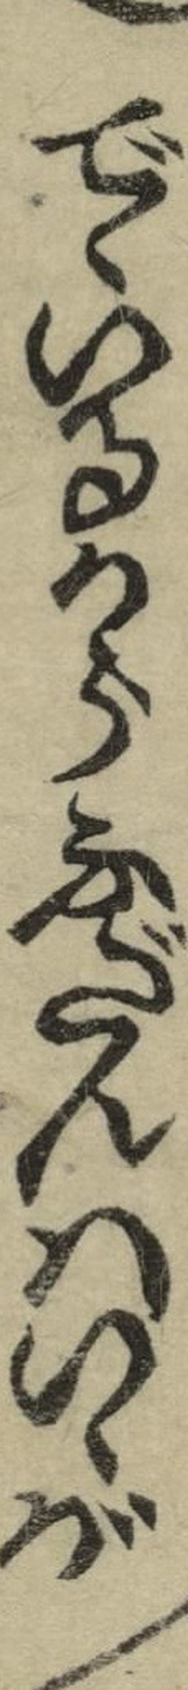でゝいるからふだんはいゝが
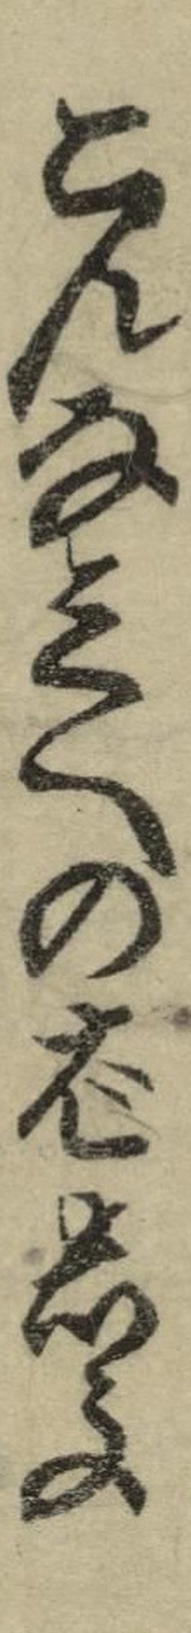こんなみへのばしよ
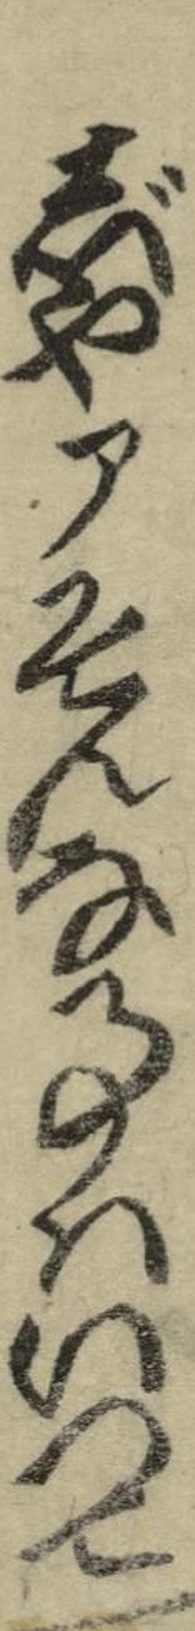じやァそんな事はいつて
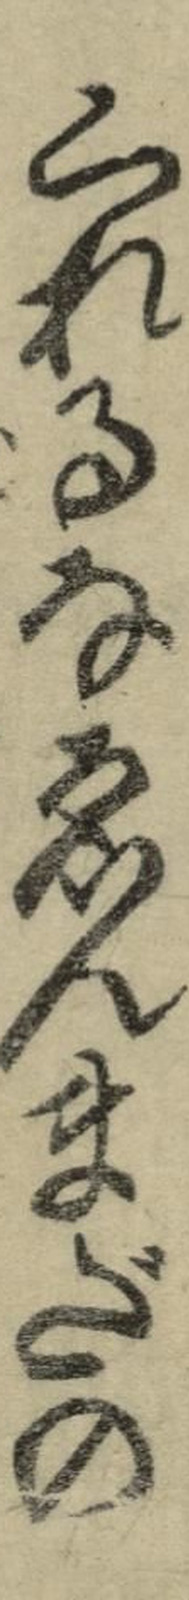くれるなゑんまだの
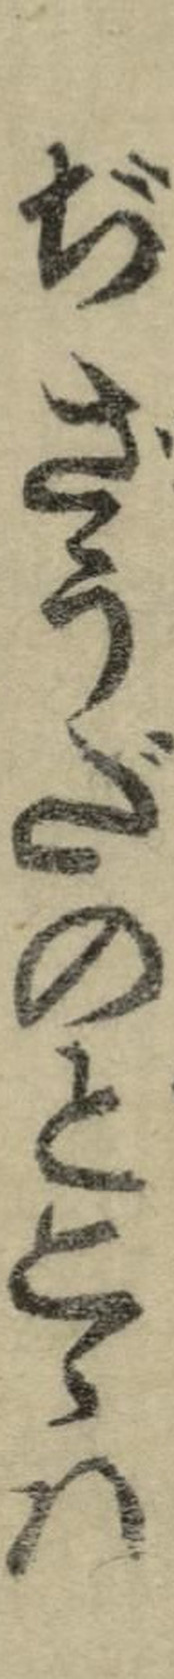ぢざうだのとこゝは
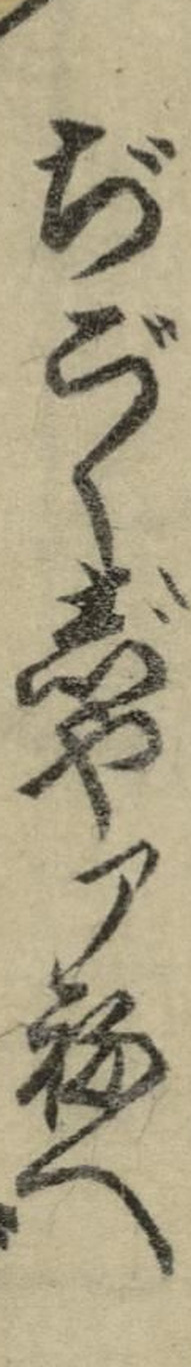ぢごくじやァねへ
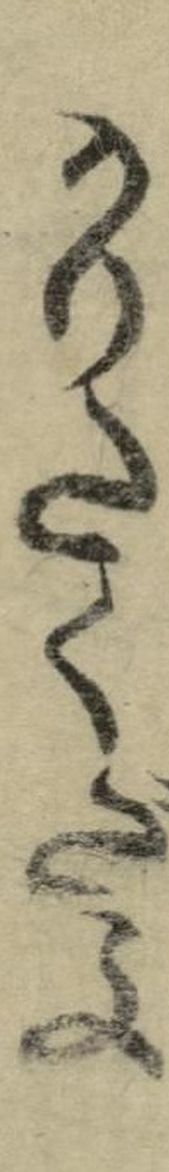かりたくだよ
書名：瓢箪
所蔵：東京大学地震研究所図書室 Earthquake Research Institute Library, The University of Tokyo, JAPAN
